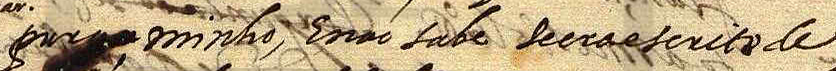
purgaminho, E naõ sabe se era escrito de
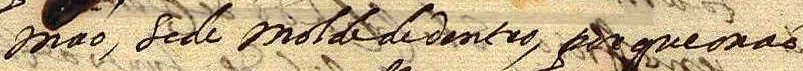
maõ, se de molde de dentro, porque o naõ
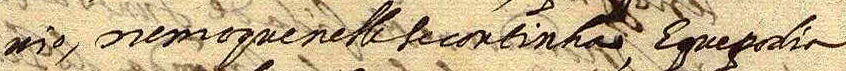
uio, nem o que nelle se continha, E que podia
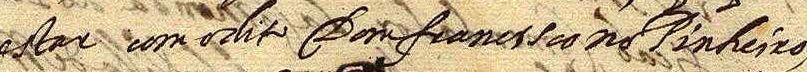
estar com o dito Dom francisco no Pinheiro,
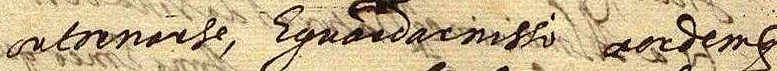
ou tornarse, E guardar nisso a ordem q̄
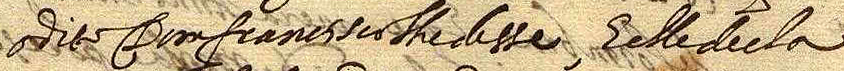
o dito Dom francisco desse, E elle decla
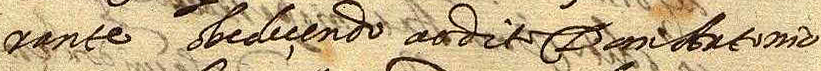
rante obedeçendo ao dito Dom Antonio
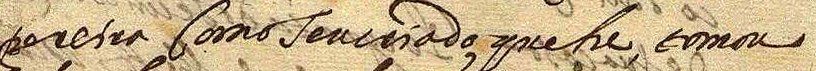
pereira Como seu criado que he, tomou
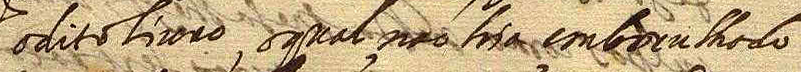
o dito liuro, o qual naõ hia embrrulhado
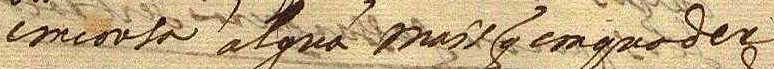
em cousa alguā mais q̄ emquader
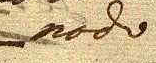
nado
